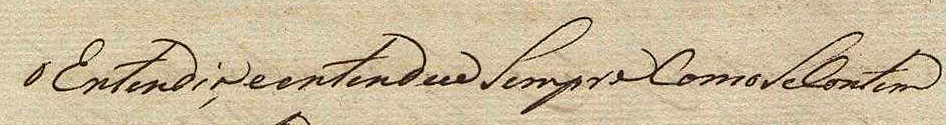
o Entendia, e entendeu Sempre Como se Contem
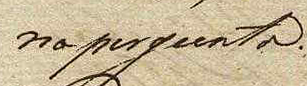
na pergunta.
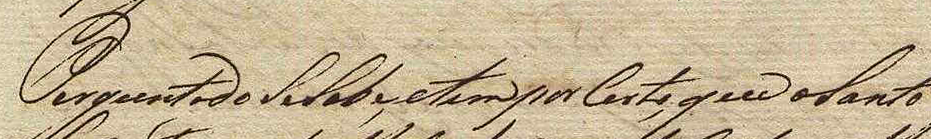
Perguntado Se sabe, e tem por Certo que o Santo
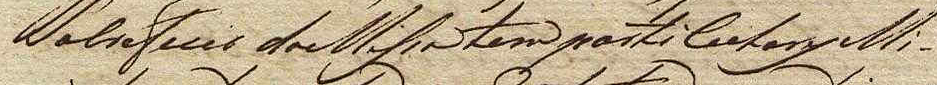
Sacreficio da Missa tem partiCulares Mi
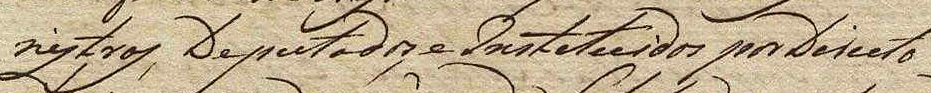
nistros, Deputados e Instetuidos por Directo
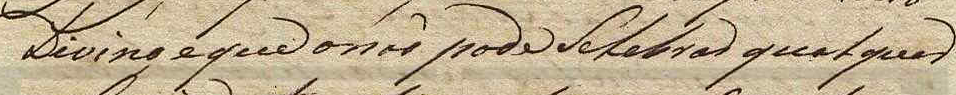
Divino, e que o naõ pode Selebrar qualquer
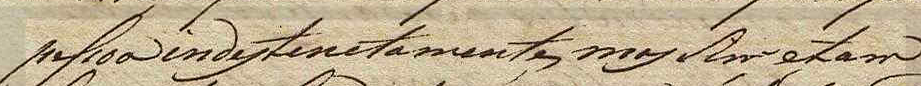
pessoa indestinctamente mas sim e tam
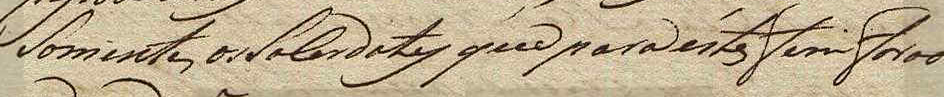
Somente os SaCerdotes que para este fim foraõ
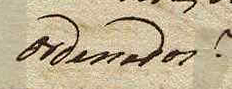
ordenados?
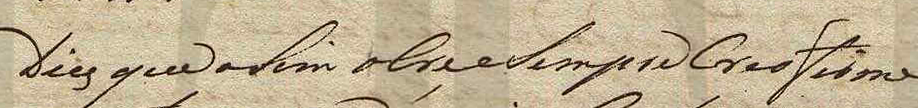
Dice que aSim o Cre e Sempre Creo firme
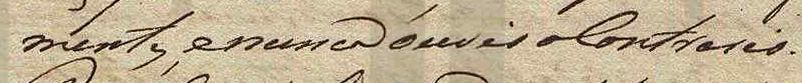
mente e nunca ouvio o Contrario.
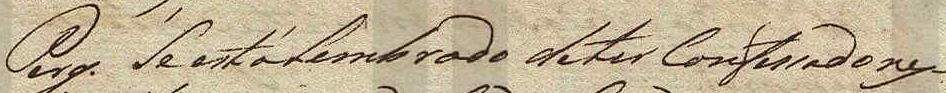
Perg. se está Lembrado de ter Confessado nes
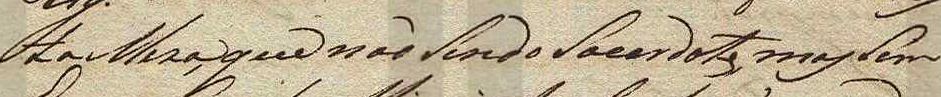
ta Meza, que naõ Sendo Sacerdote, mas Sem
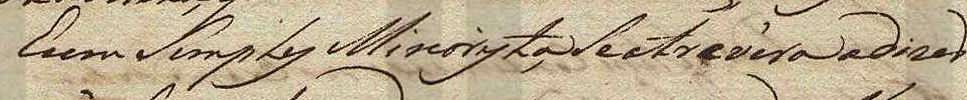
hum semples Minorista, Se atrevera a dizer
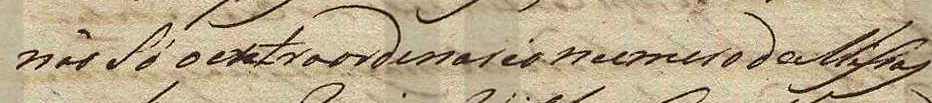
naõ só o extraordinario numero de Missas
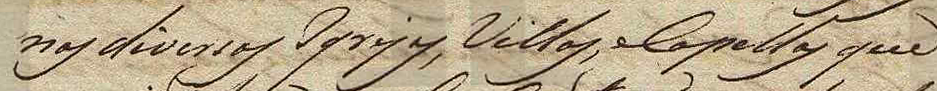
nas diversas Igrejas, Villas, e Capellas que
